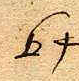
64
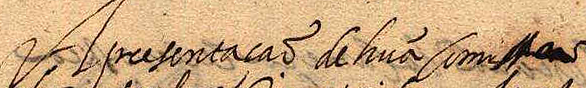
Apresentaçaõ de huā Comissaõ
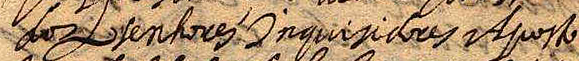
dos senhores Inquisidores Aposto
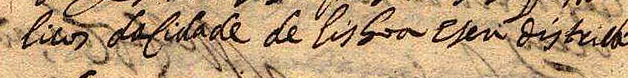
licos da Cidade de Lisboa E seu districto
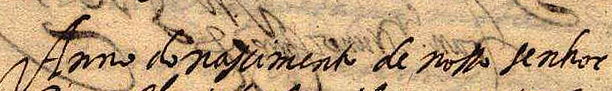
Anno do nascimento de nosso senhor
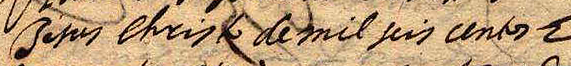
Jesus Christo de mil seiscentos E
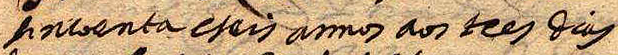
sincoenta e seis annos aos tres dias
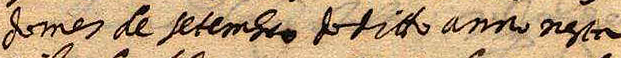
do mes de setembro do ditto anno nesta
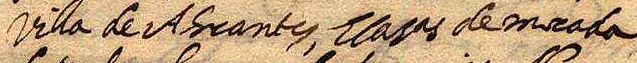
Villa de Abrantes, E cazas de morada
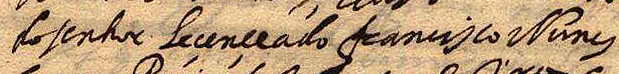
do senhor Leçençeado francisco Nunes
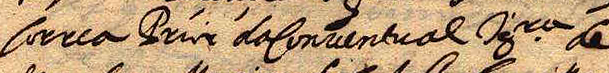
Correa Prior da Conuentual Ig.ra de
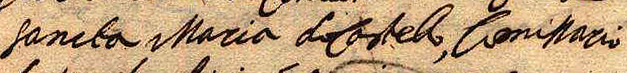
sancta Maria do Castello, Comissario
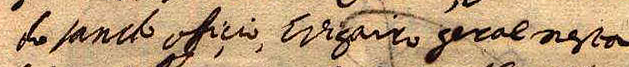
do sancto offiçio, E vigairo geral nesta
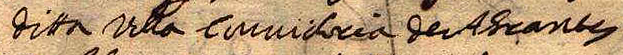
ditta villa E ouuidoria de Abrantes
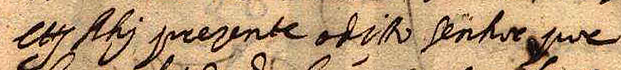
ettꝭ Ahj prezente o ditto senhor por
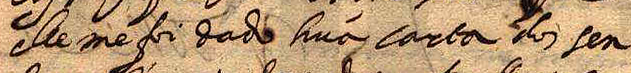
elle me foi dado huā carta dos sen
